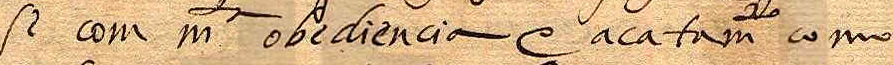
se com mta obediencia e acatamto como
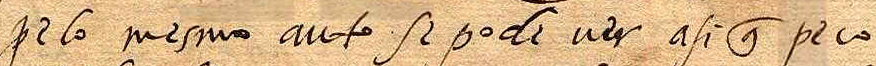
pelo mesmo auto se pode uer asi q̄ peço
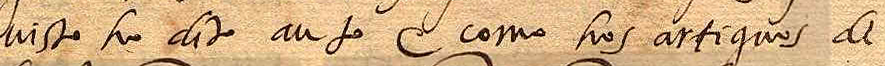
uisto ho dito auto e como hos artiguos de
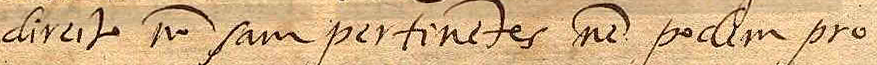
direito nō sam pertinētes nē podem pro
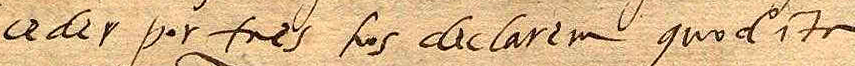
ceder por taes hos declarem quod ita
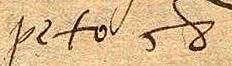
peto cꝭ̄
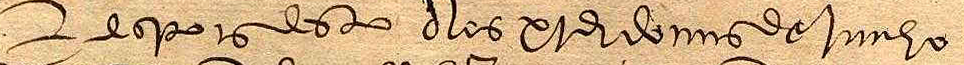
E despois desto Aos xj di do mes de Junho
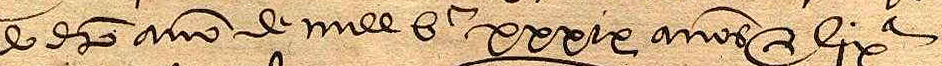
do dt̄o anō de mill bc xxxix anos ē lixa
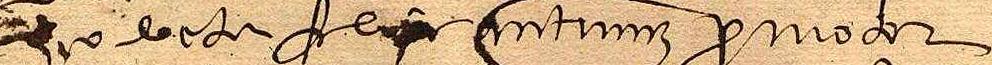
ho doctor felipe antunez ꝓmotor
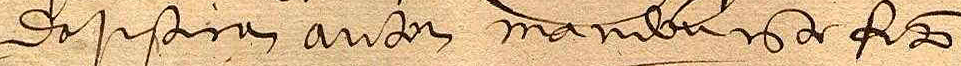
da Justiça autor mandou este fctō
